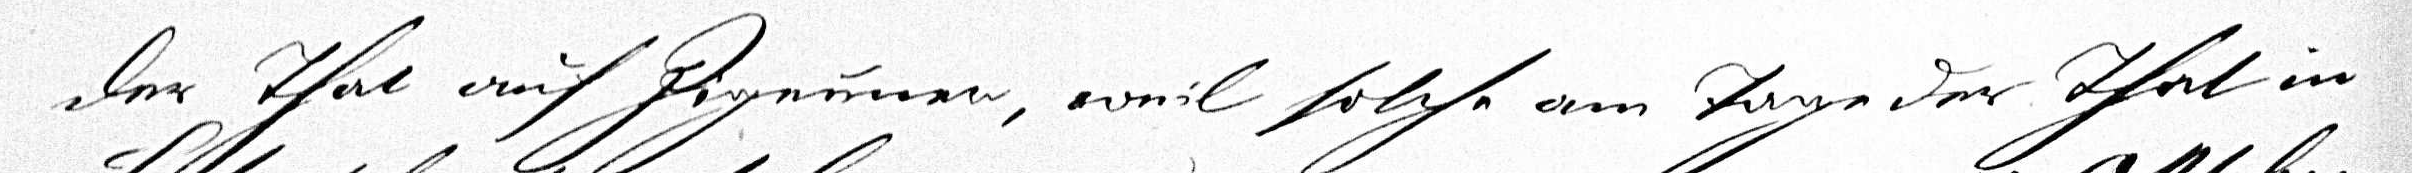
der That auf Zigeuner, weil solche am Tage der That in
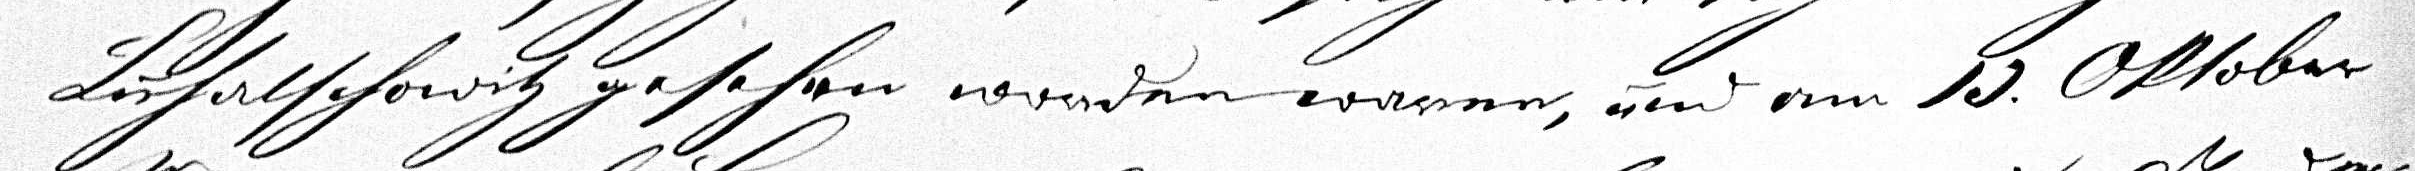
Luhatschowitz gesehen worden waren, und am 13. Oktober
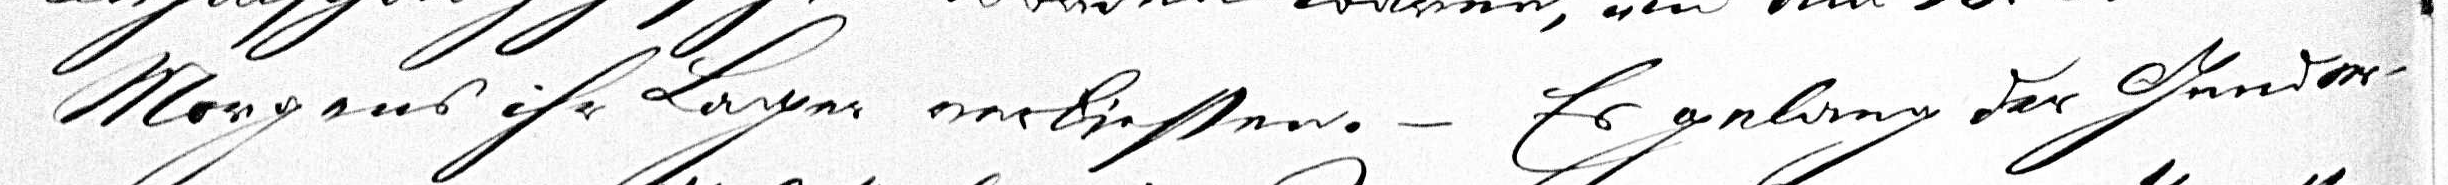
Morgens ihr Lager verließen. Er gelang der Gendar¬
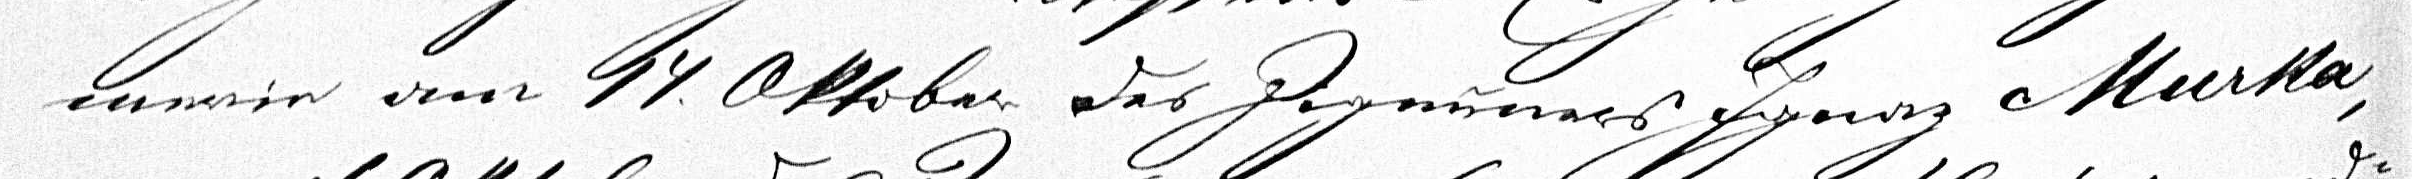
merie am 14. Oktober des Zigeuners Ignaz Murka
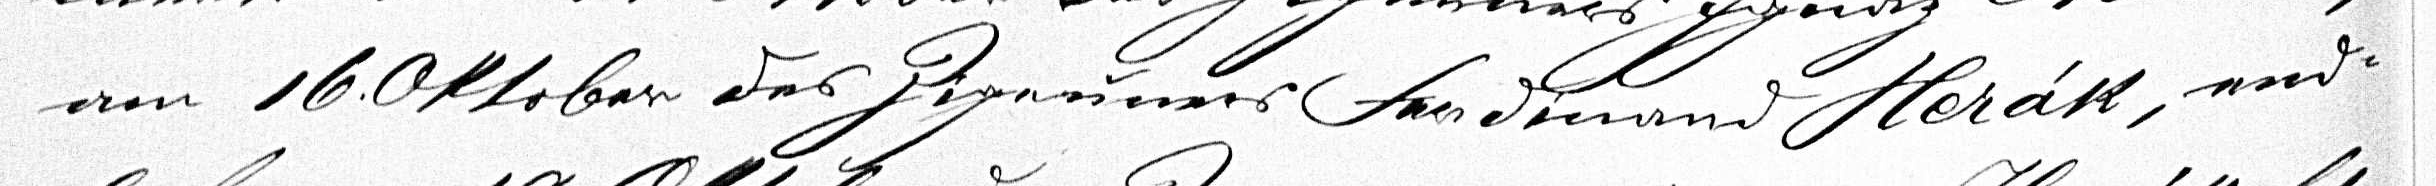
am 16. Oktober des Zigeuners Ferdinand Herák end¬
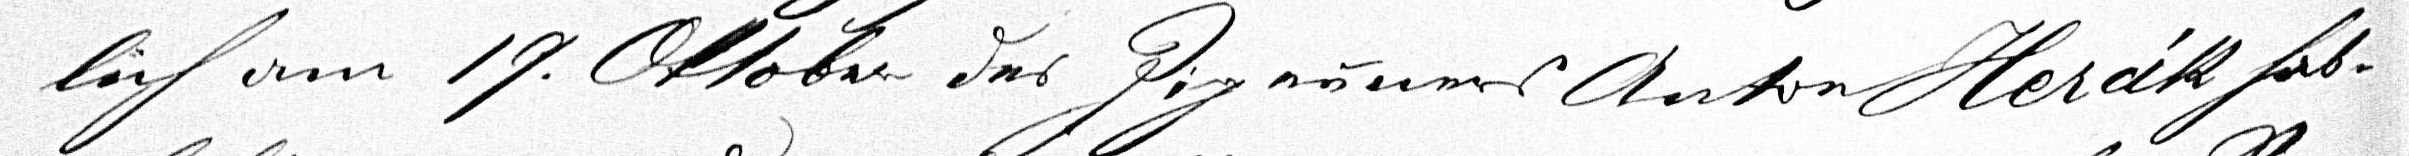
lich am 19. Oktober des Zigeuners Anton Herák hab¬
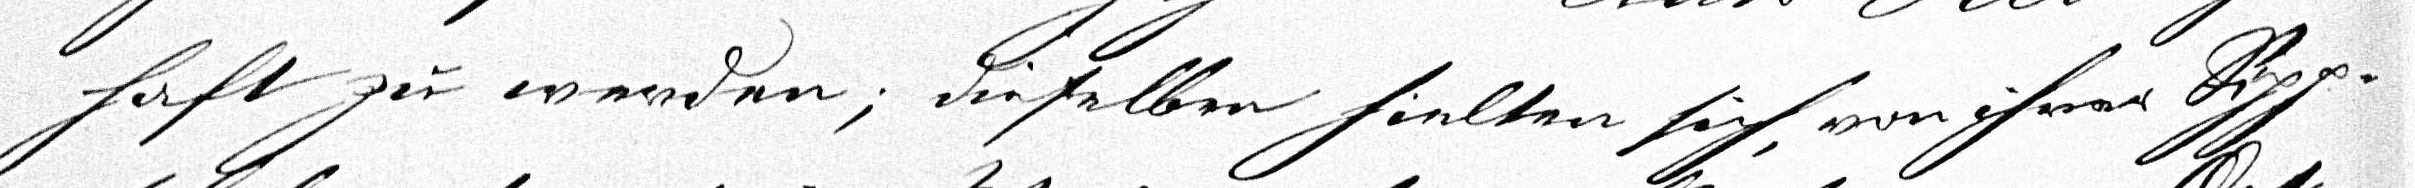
haft zu werden; dieselben hielten sich, von ihrer Sipp¬
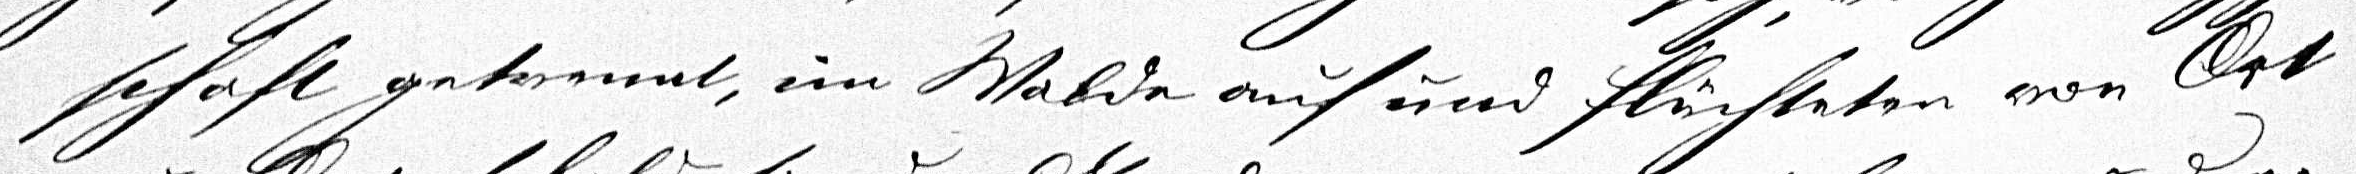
schaft getrennt, im Walde auch und flüchteten von Ort
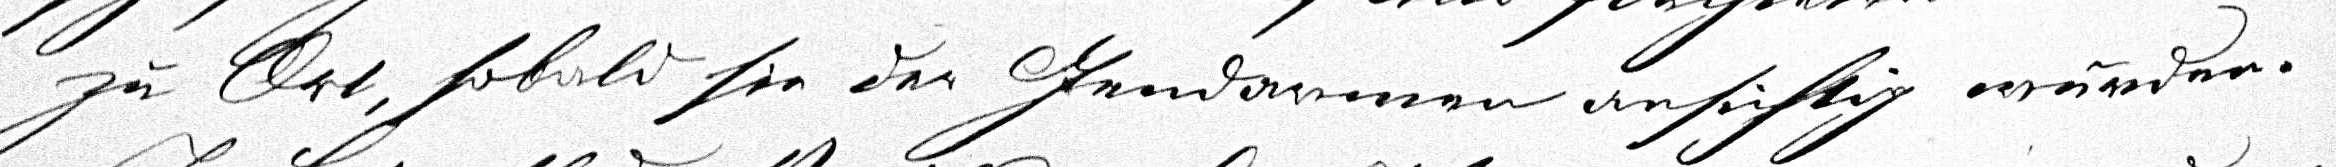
zu Ort, sobald sie der Gendarmen ansichtig wurden.
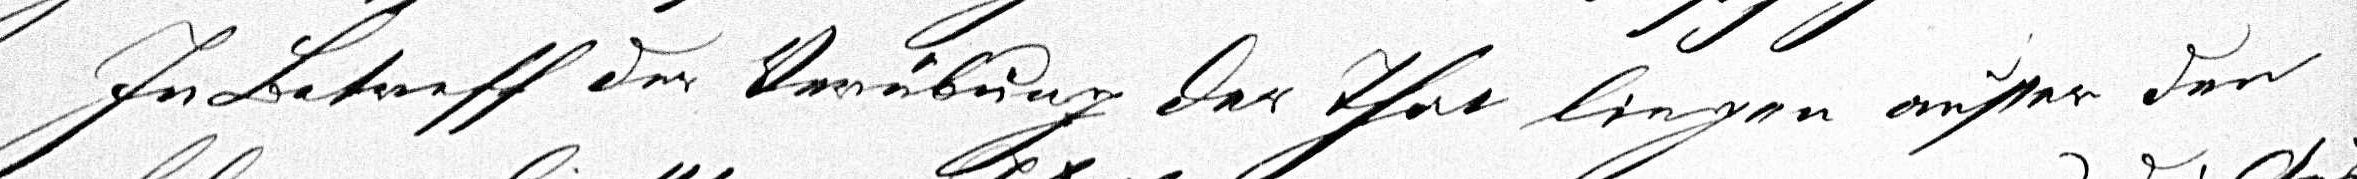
In Betreff der Verübung der That liegen außer den
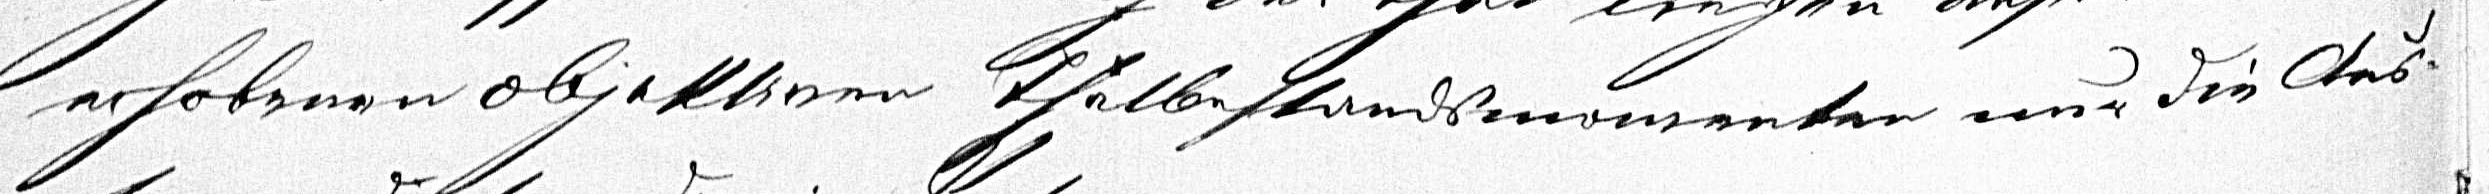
erhobenen objektiven Thatbestandsmomenten nur die Aus¬
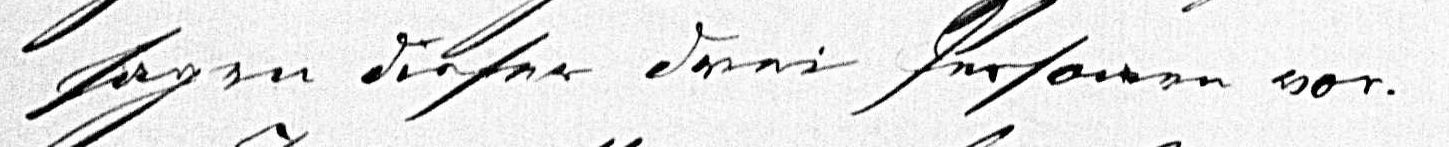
sagen dieser drei Personen vor.
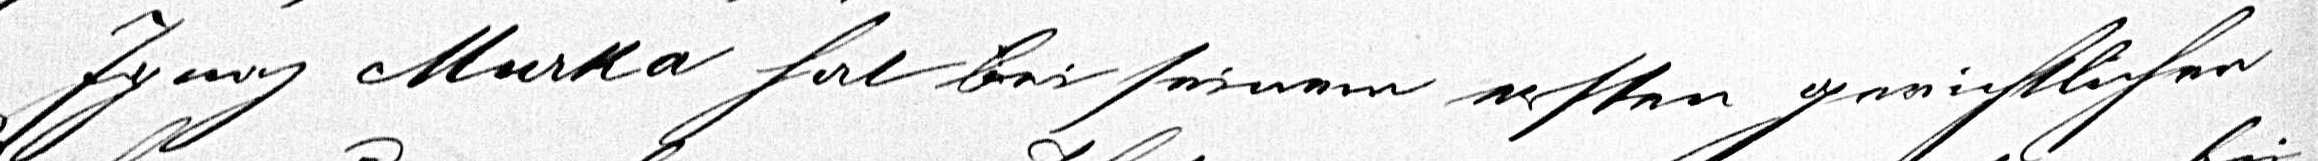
Ignaz Murka hat bei seinem ersten gerichtlichen
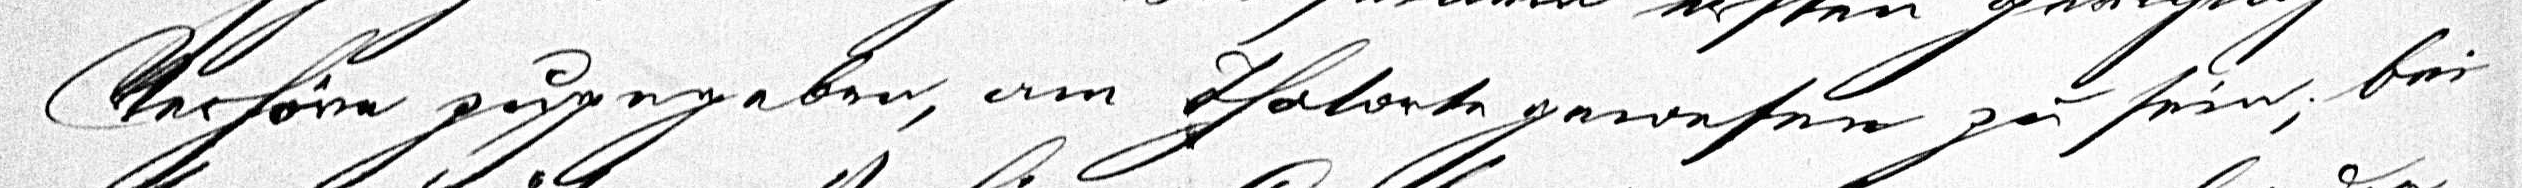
Verhöre zugegeben, am Thatorte gewesen zu sein; bei
